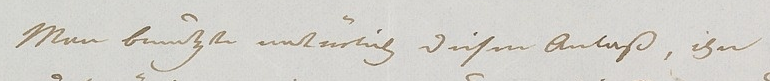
Man benutzte natürlich diesen Anlaß, ihn
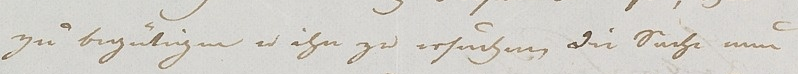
zu begütigen u ihn zu ersuchen, die Sache nun
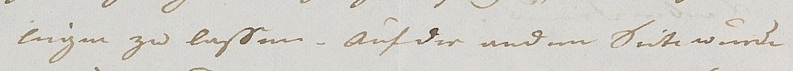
liegen zu lassen. Auf der andern Seite wurde
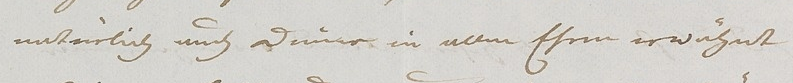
natürlich auch deiner in allen Ehren erwähnt
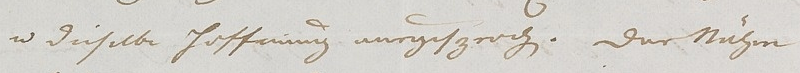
u dieselbe Hoffnung ausgesprochen. Das Nähere
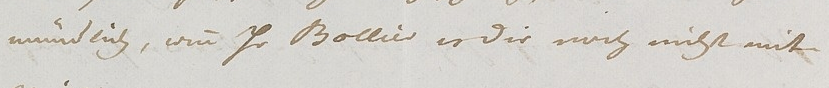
mündlich, wenn Hr Bollier es dir noch nicht mit-
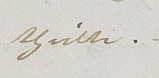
theilte. –
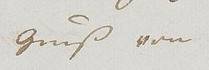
Gruß von
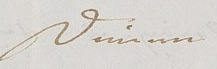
Deinem
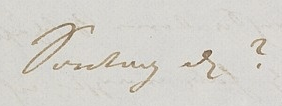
Sontag den?
